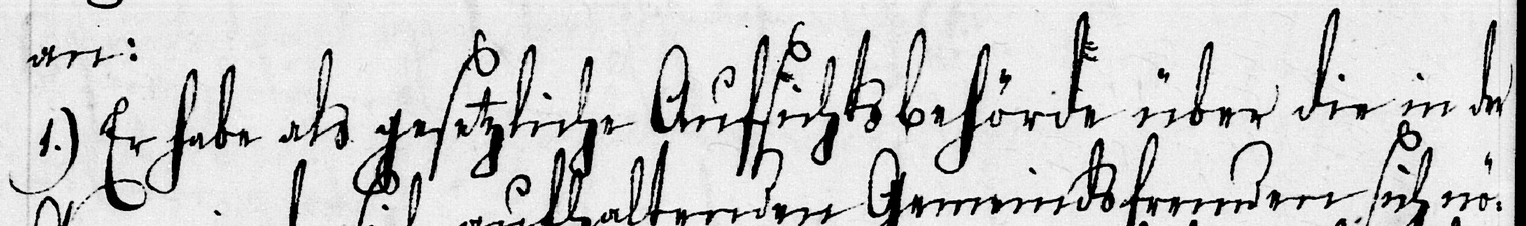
Er habe als gesetzliche Aufsichtsbehörde über die in
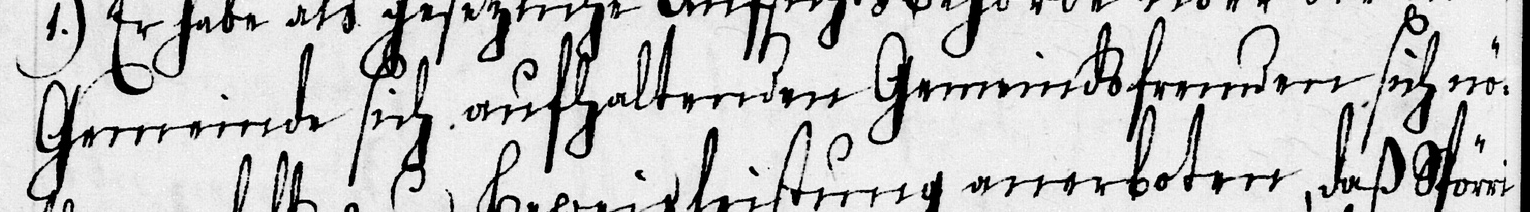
Gemeinde sich aufhaltenden Gemeindsfremden sich n¬
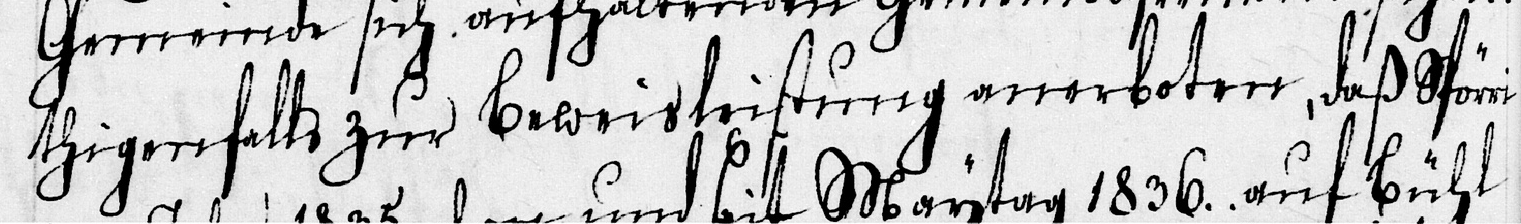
öthigenfalls zur Beweisleistung anerboten, daß Spör¬
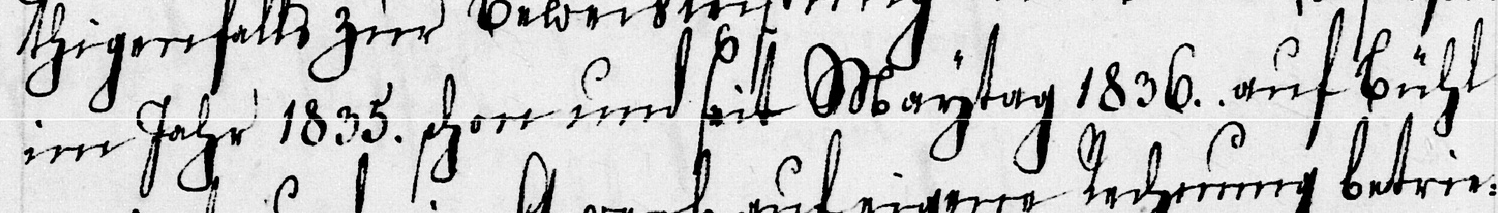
im Jahr 1835. schon und seit Maytag 1836. auf Bühl
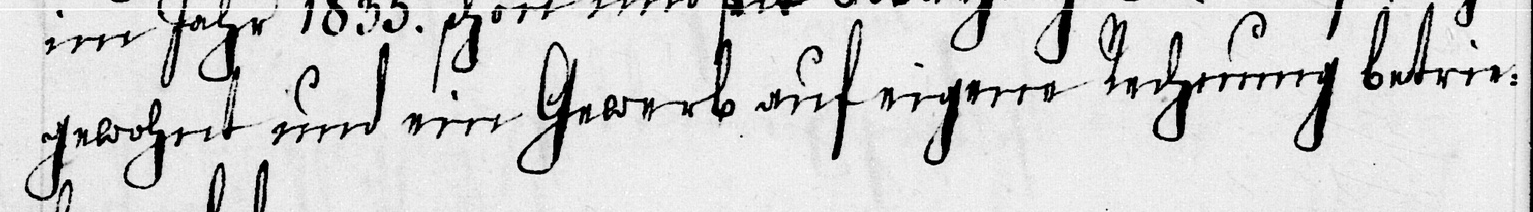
gewohnt und ein Gewerb auf eigene Rechnung betrie¬
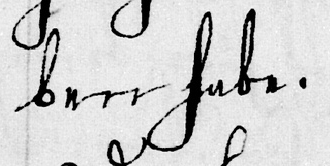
ben habe.
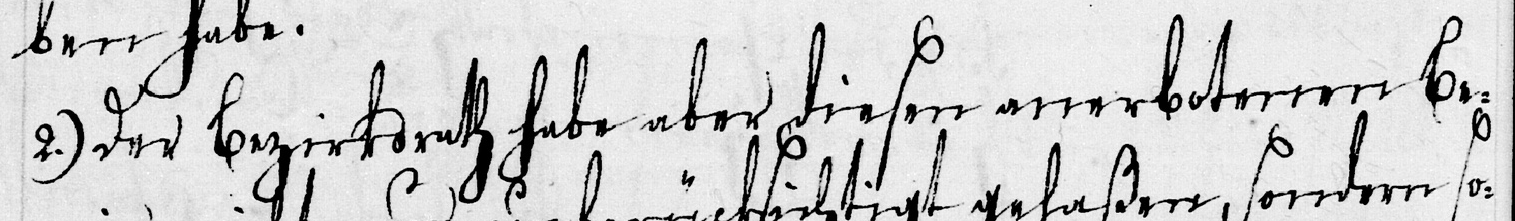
2.) Der Bezirksrath habe aber diesen anerbotenen Be¬
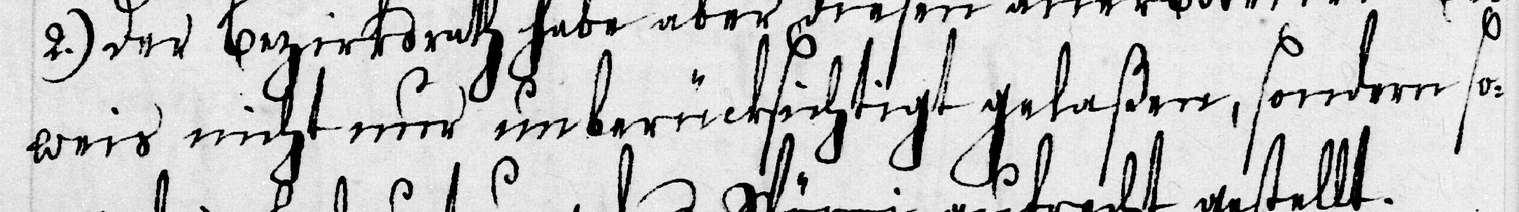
weis nicht nur unberücksichtigt gelaßen, sondern so¬
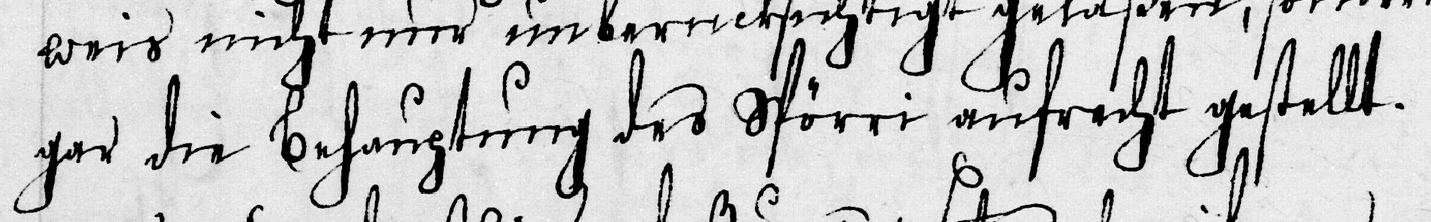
gar die Behauptung des Spörri aufrecht gestellt.
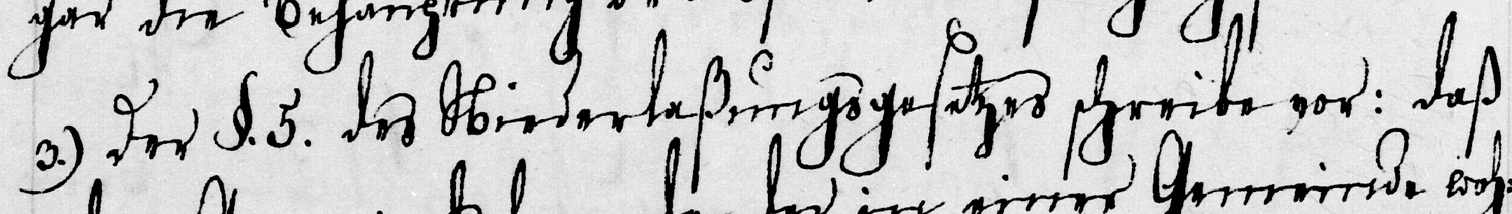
3.) Der §. 5. des Niederlaßungsgesetzes schreibe vor: daß
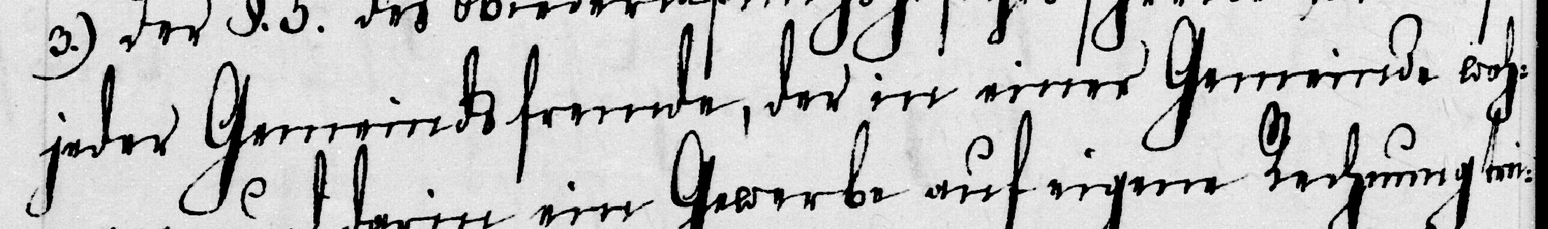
jeder Gemeindsfremde, der in einer Gemeinde woh¬
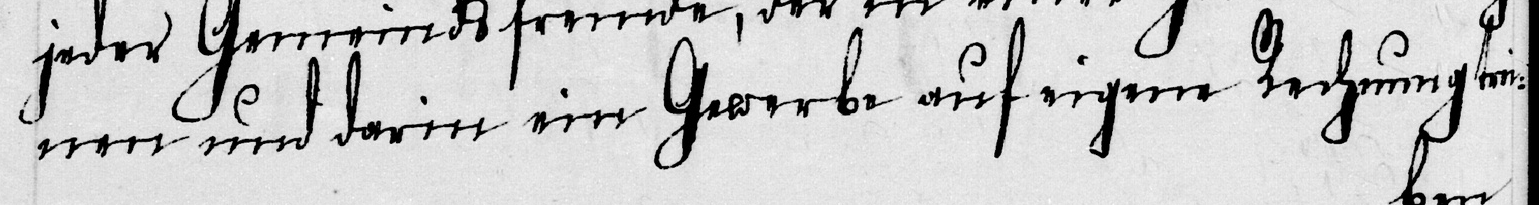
nen und darin ein Gewerbe auf eigene Rechnung tr¬
